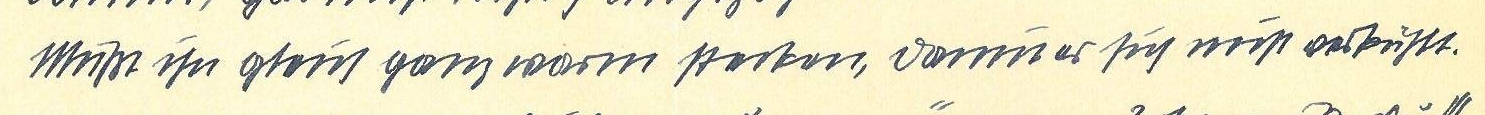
Mußt ihn gleich ganz warm stecken, damit er sich nicht verkühlt.
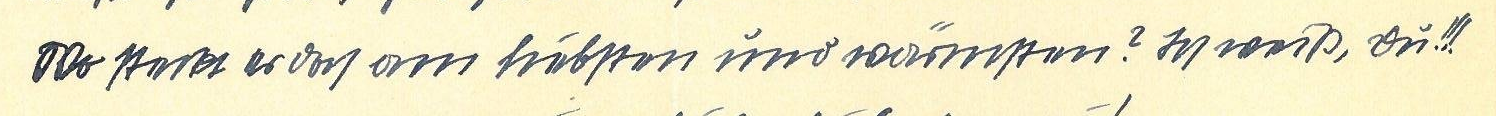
Wo steckt er doch am liebsten und am wärmsten? Ich weiß, Du!!!
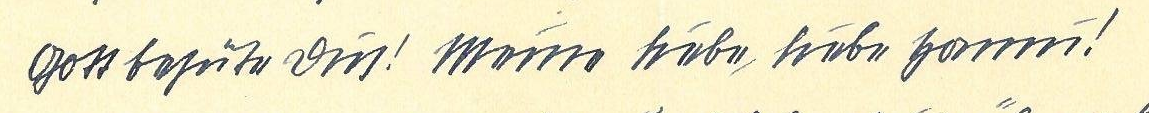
Gott behüte Dich! Meine liebe, liebe!
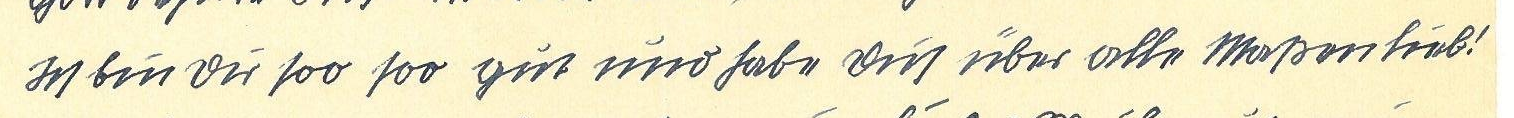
Ich bin Dir soo soo gut und habe Dich über alle Maßen lieb!
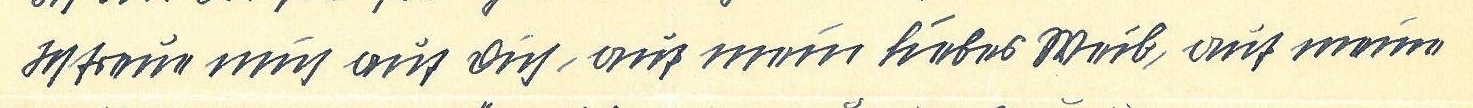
Ich freue mich auf Dich, auf mein liebes Weib, auf meine
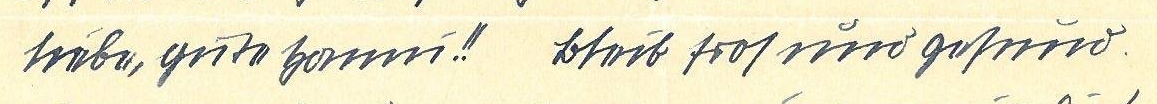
liebe, gute!! Bleib froh und gesund.
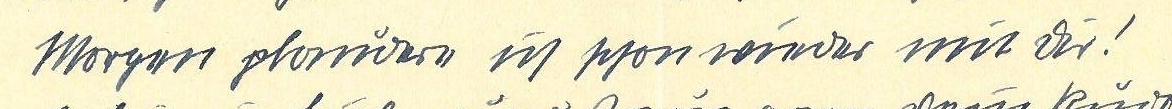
Morgen plaudere ich schon wieder mit Dir!
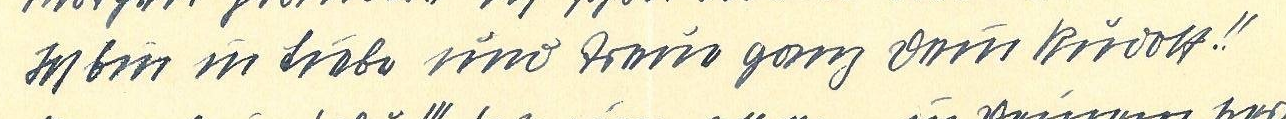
Ich bin in Liebe und Treue ganz Dein!!
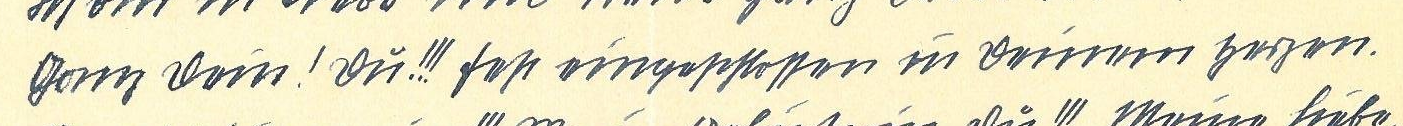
Ganz Dein! Du!!! Fest eingeschlossen in Deinem Herzen.
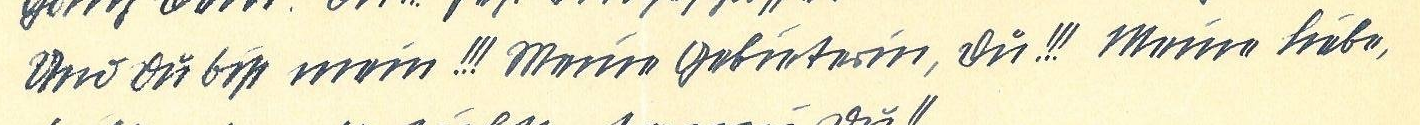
Und Du bist mein!!! Meine Gebieterin, Du!!! Meine liebe,
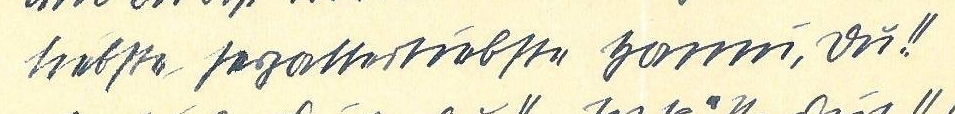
liebste, herzallerliebste, Du!!
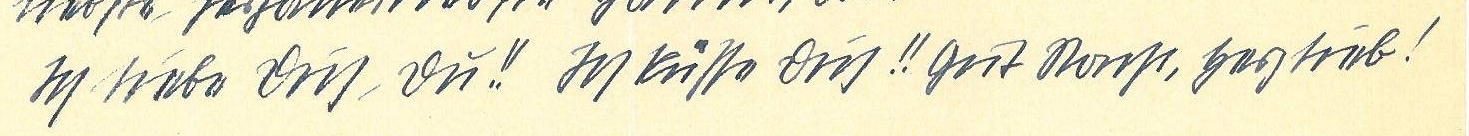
Ich liebe Dich, Du!! Ich küsse Dich!! Gut Nacht, Herzlieb!
